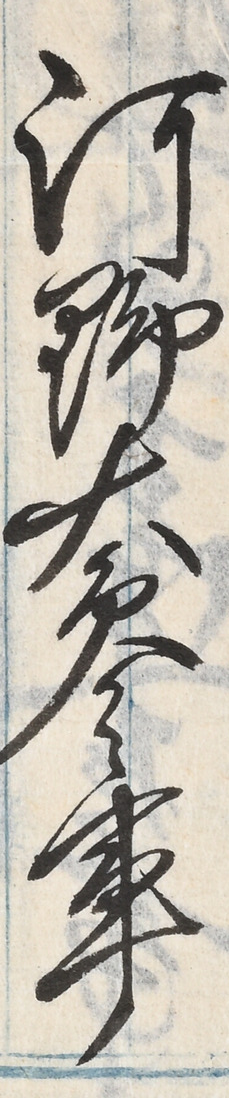河野大参事
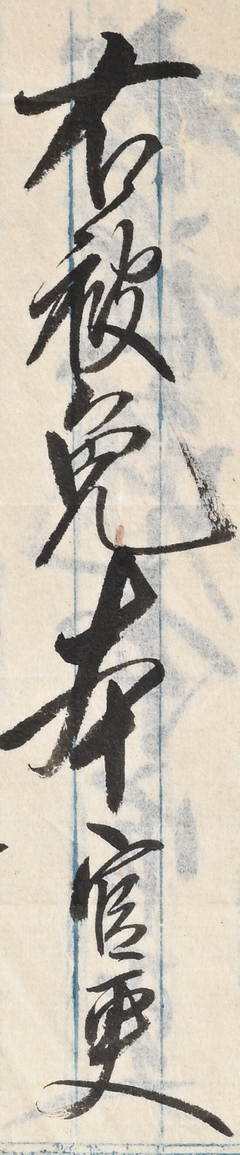右被免本官吏
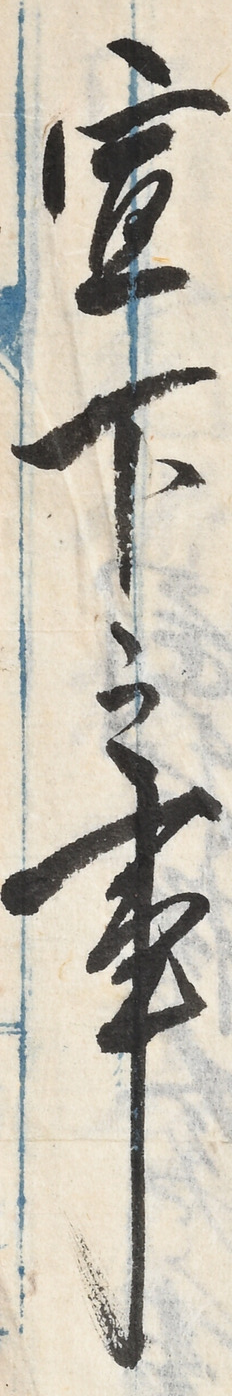宣下之事

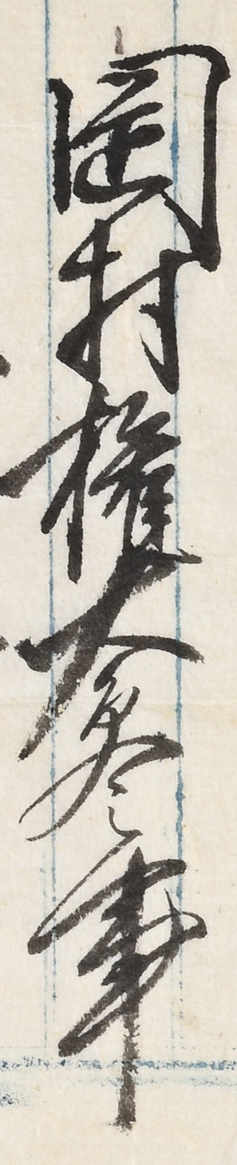岡村権大参事
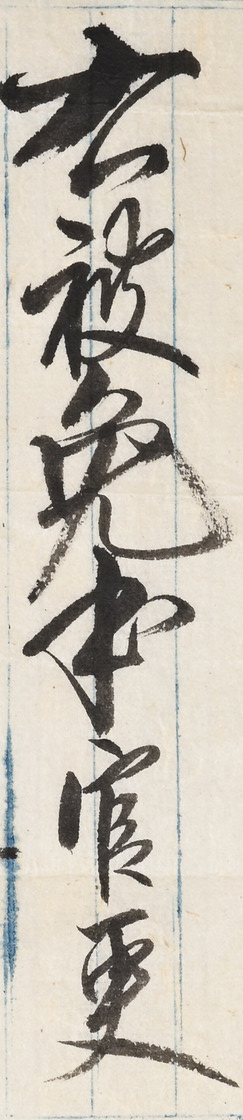右被免本官吏
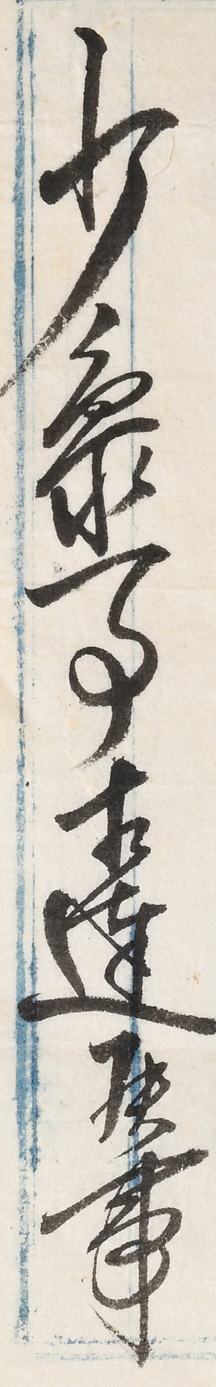少参事相達候事
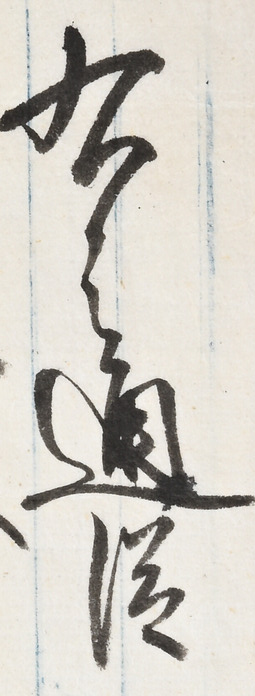右之通従
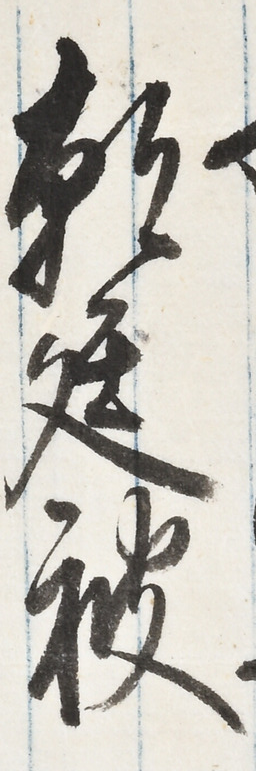朝廷被
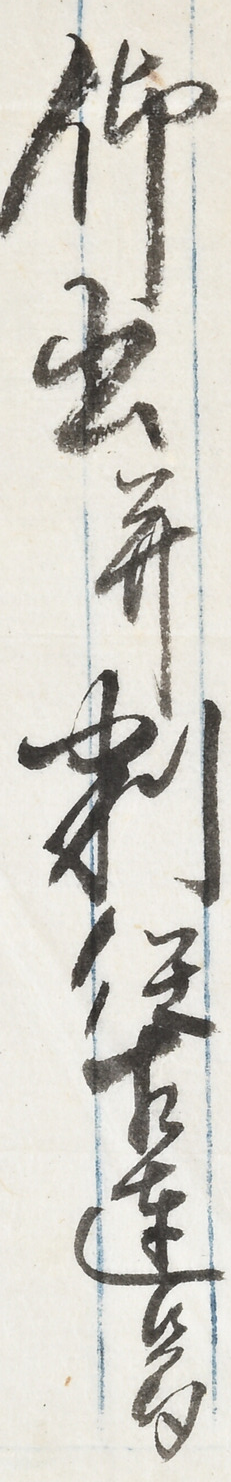仰出幷判任相達候間
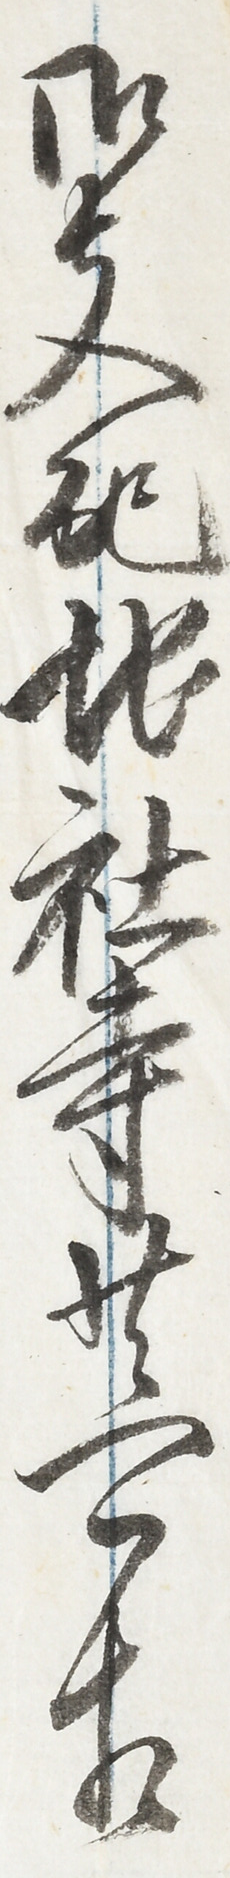御支配地社寺共可相

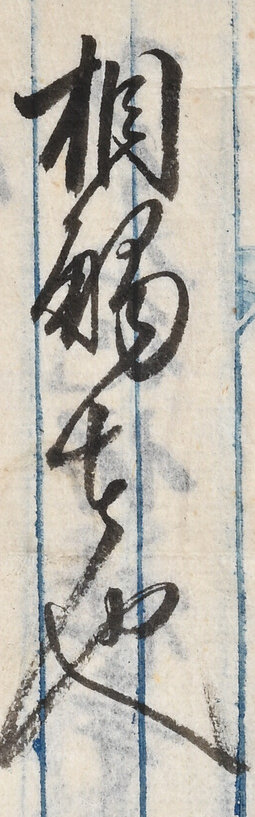相触者也
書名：（被免状）
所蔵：伊那市立高遠町図書館・合同会社AMANE
